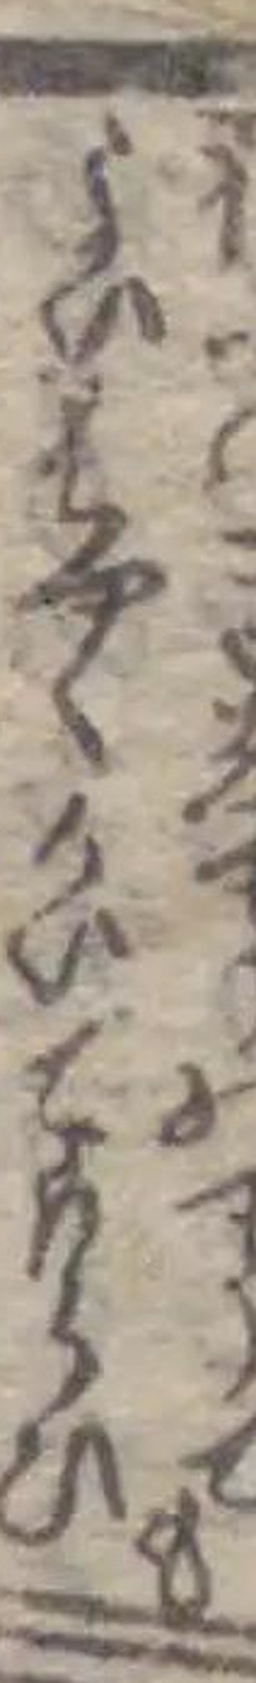よいはやくかいてもらひ
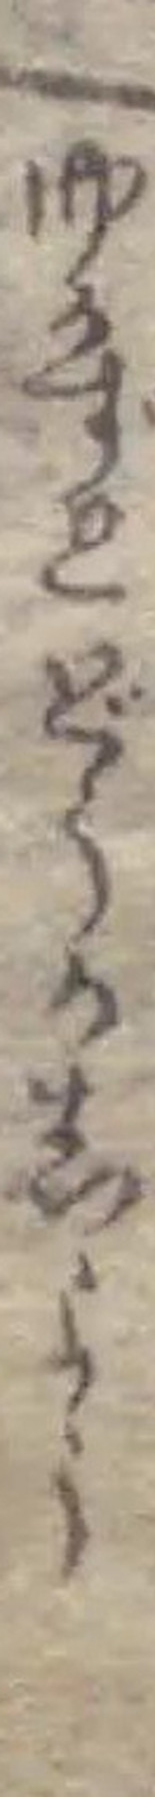ゆかずとどうかしよう
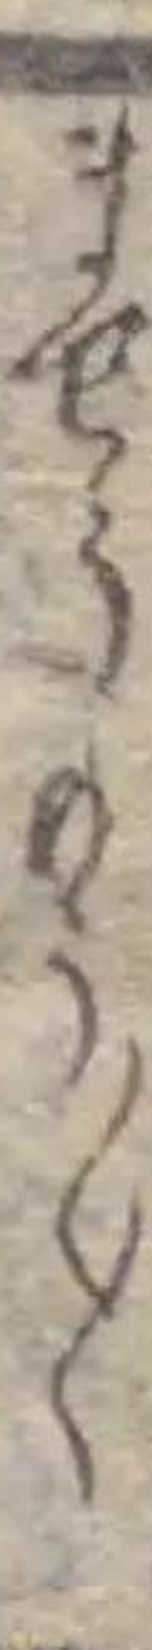ませうもう〳〵〳〵
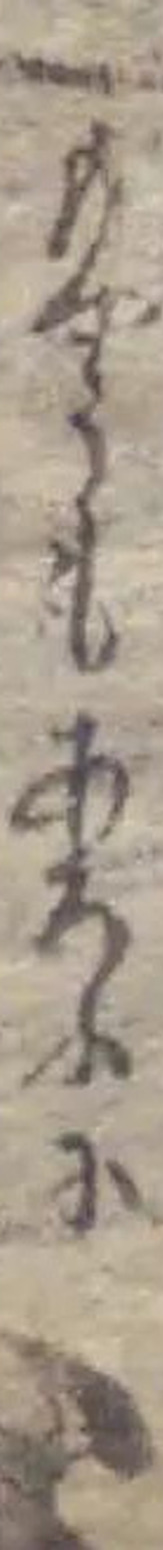もやうもあろふに
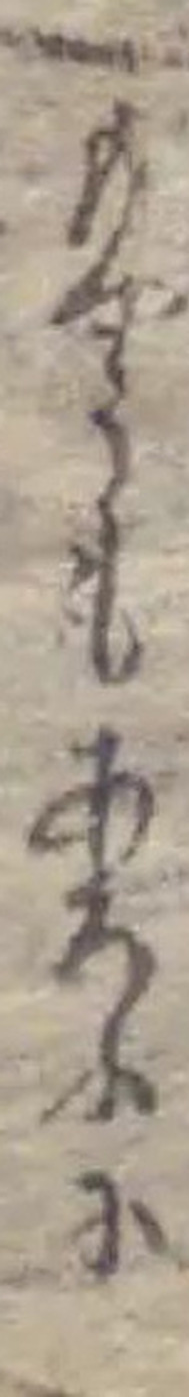もやうもあろふに
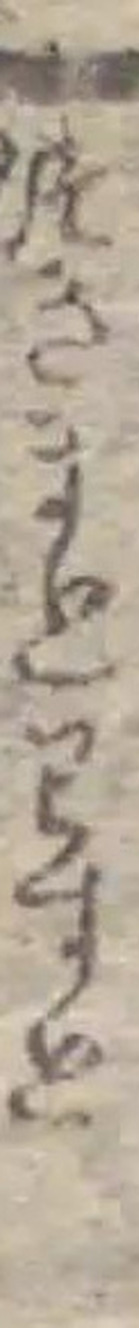つきまとわすと
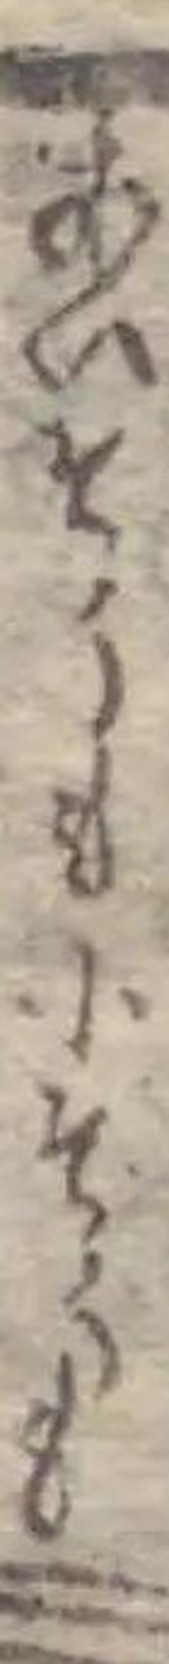あいそうも小そうも
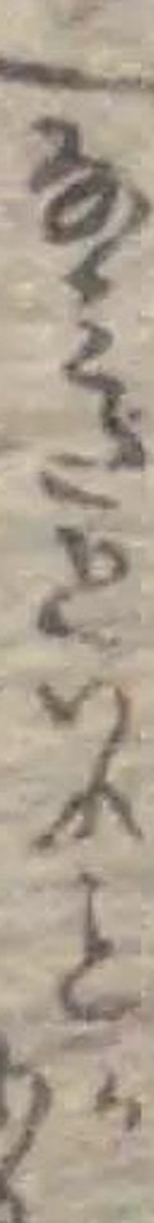なみだといふことか
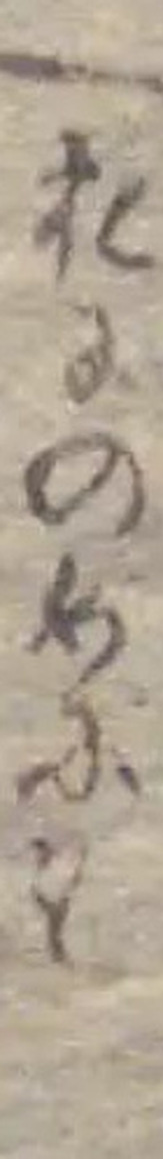おにのめにも
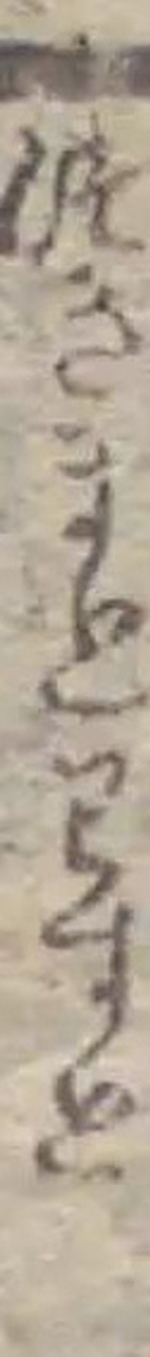つきまとわすと
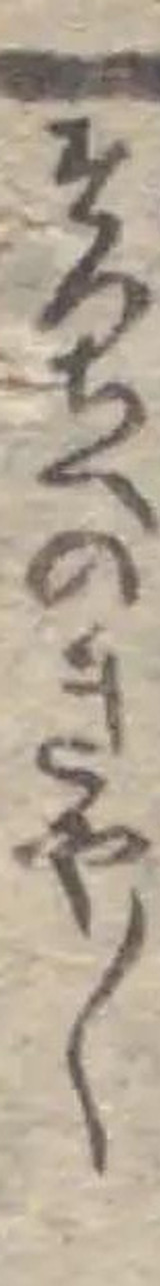そつちへのきや〳〵

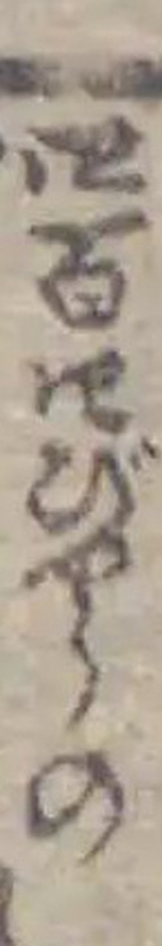四百四びやうの
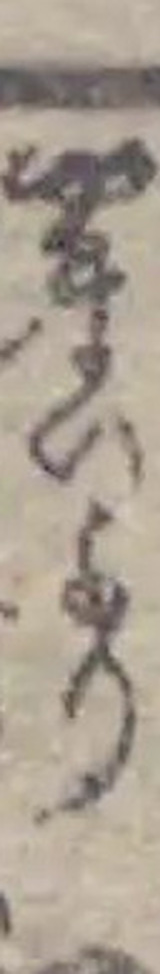やまいより
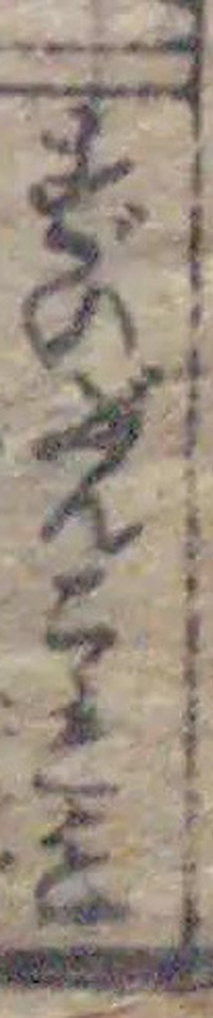ずいぶんこれ迄
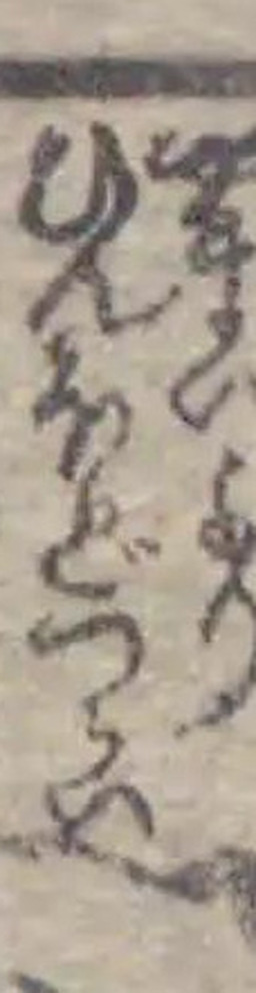ひんほどつらい
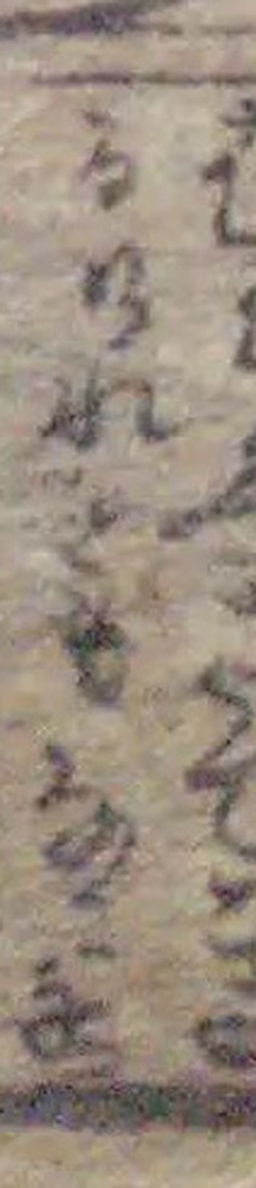るけれともなにを
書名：福壽海旡量品玉 3巻
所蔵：国立国会図書館 National Diet Library, JAPAN
